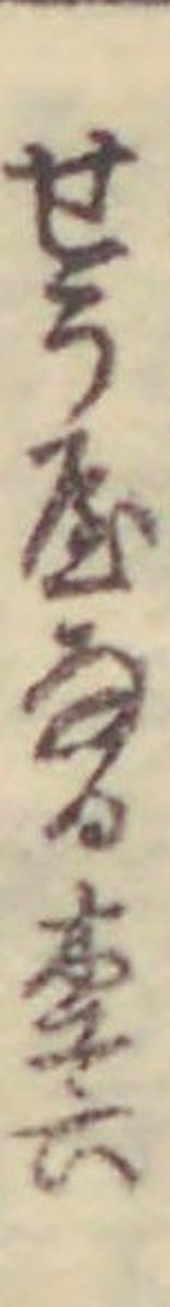せう屋なる杢六
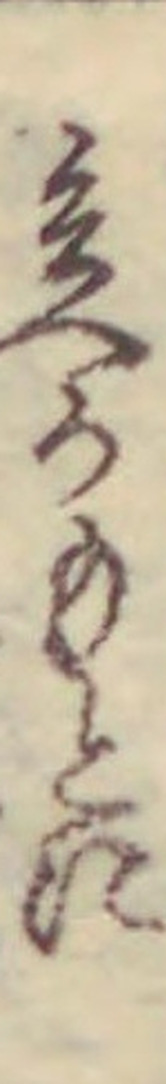兵へかもとに
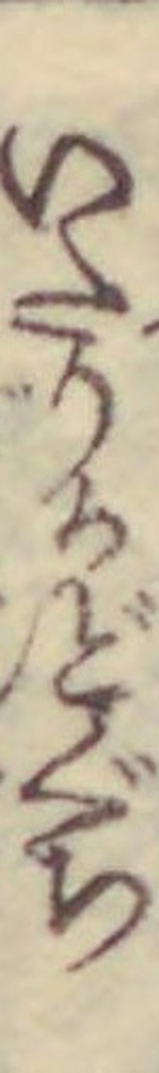いたりかどぐち
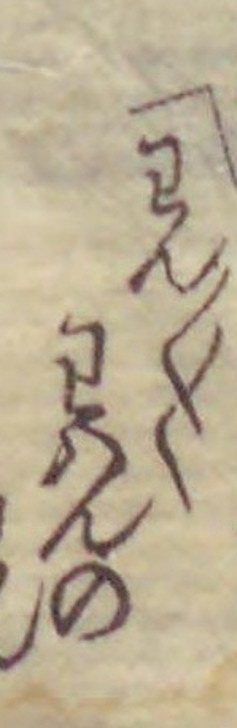わはんの
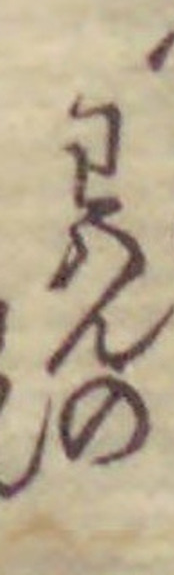わはんの
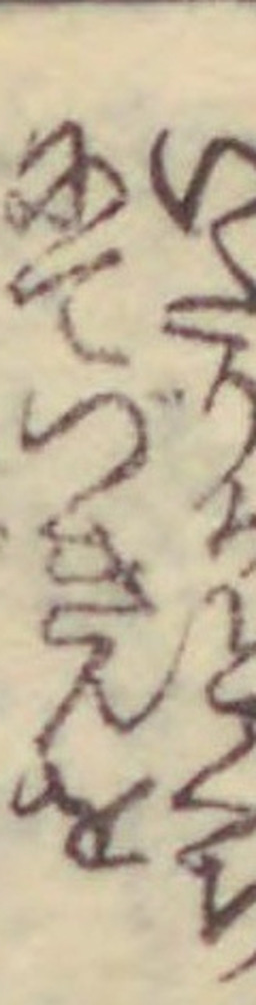にてづきんを
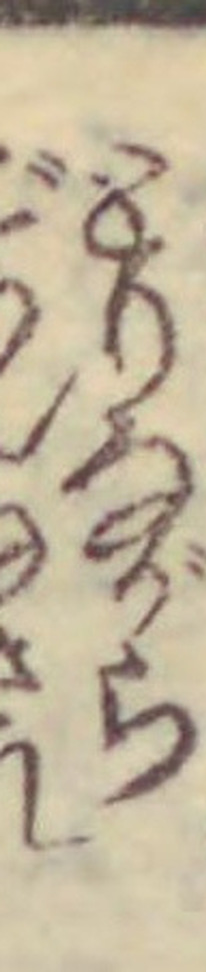とりながら
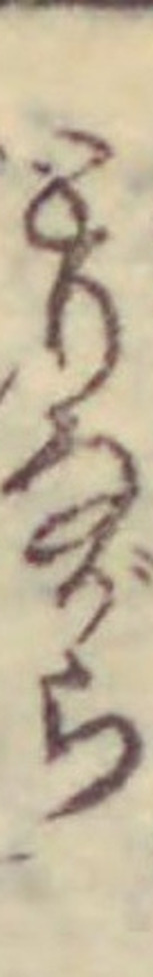とりながら
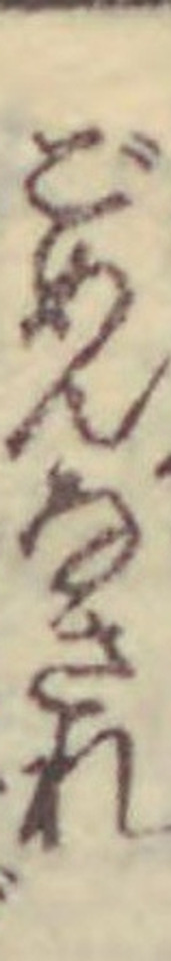ごめんなされ
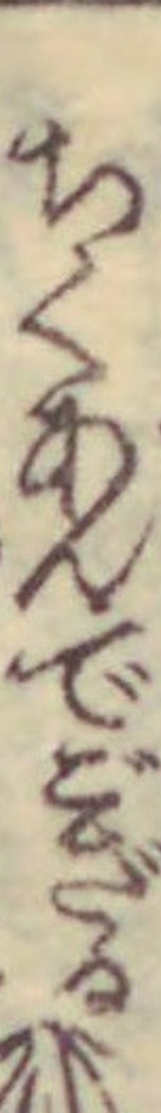ちくあんでござる
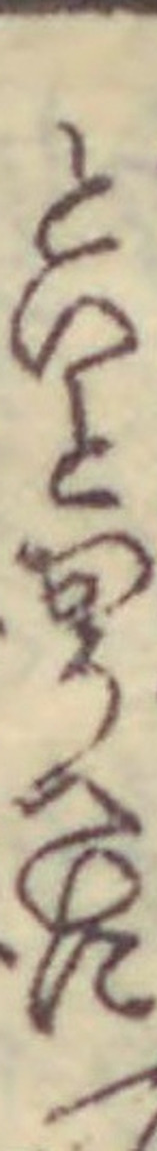といとおうへいに
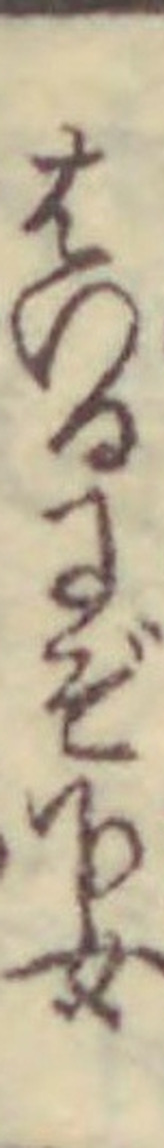はいるにぞ下女
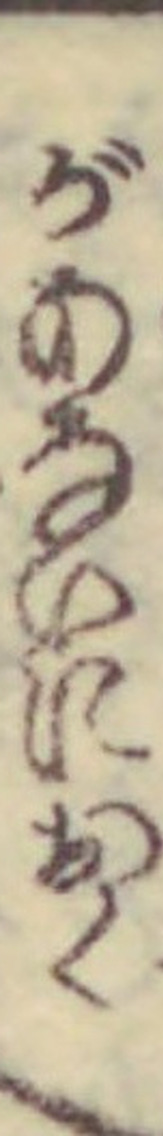があないにおく
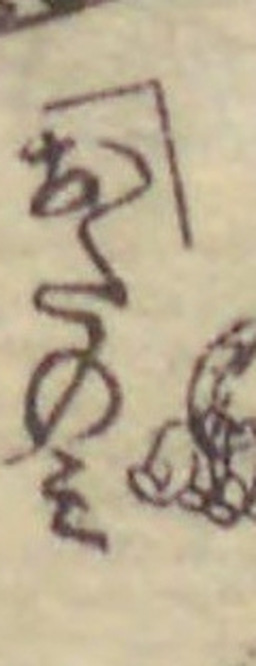〽おたのみ
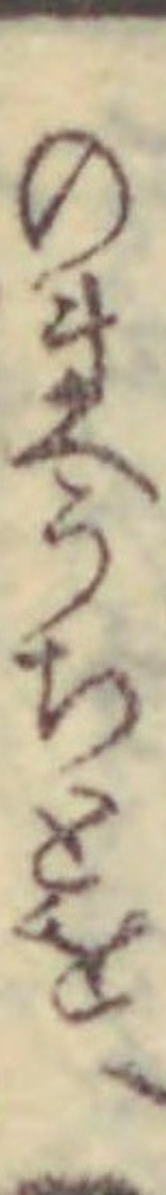のまへうちとを
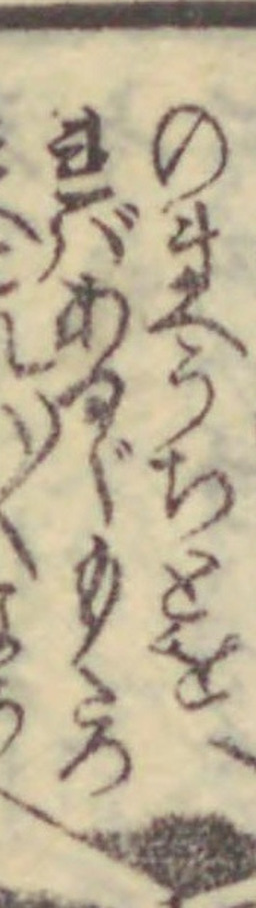れはあるじもくろ
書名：腹内窺機関 2巻
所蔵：国立国会図書館 National Diet Library, JAPAN
